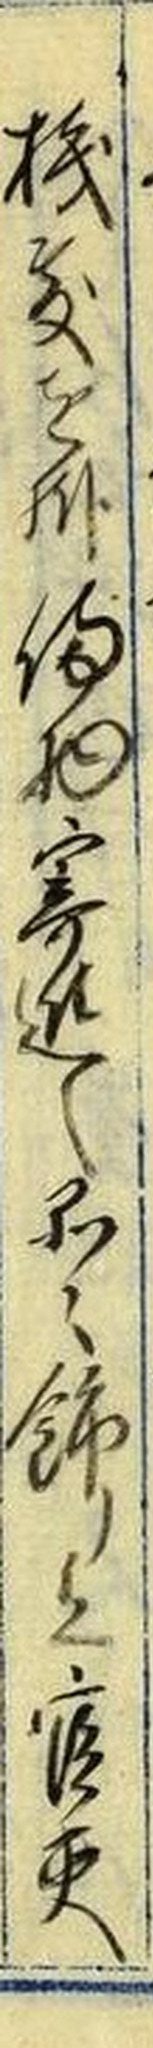桟敷を掛備物寄進之品々飾り立官吏
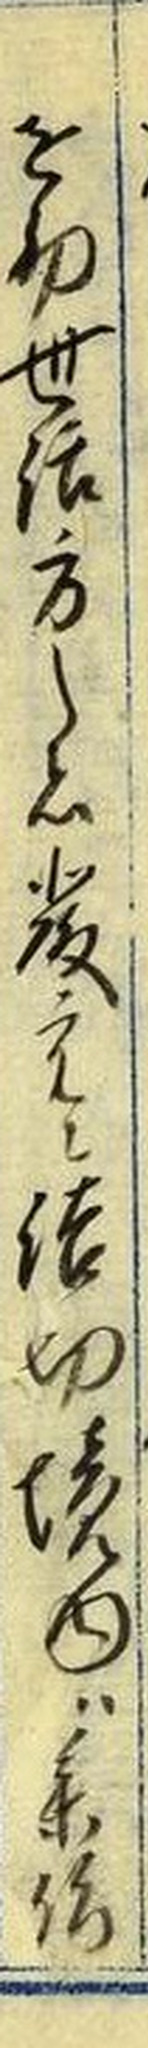を初世話方之者厳重ニ詰切境内ハ参詣
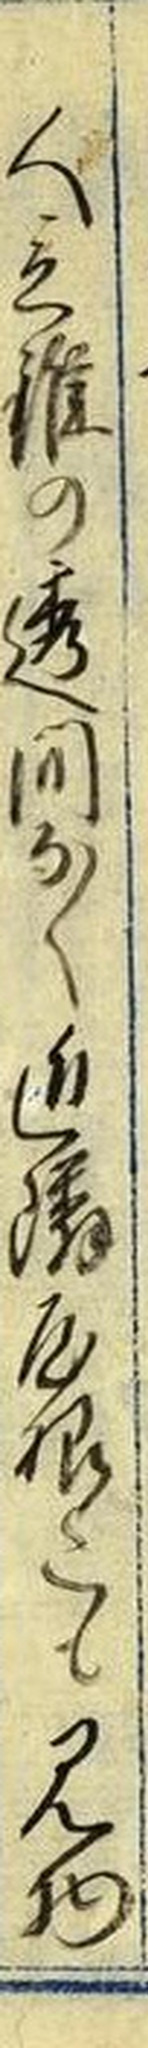人立錐の透間なく近隣屋根迄も見物
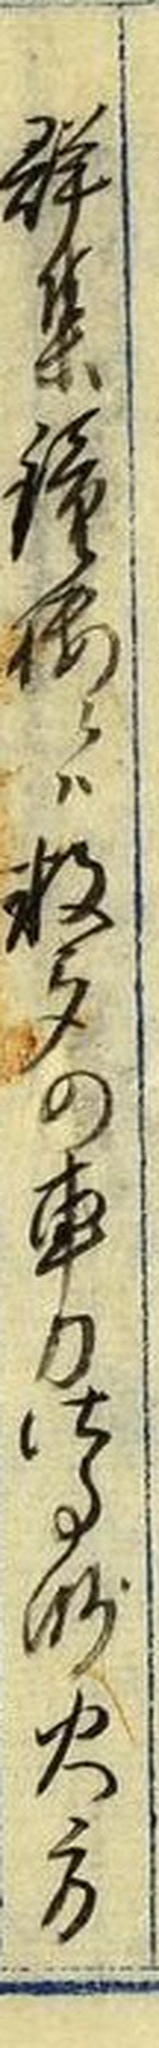群集鐘楼ニハ数多の車力仕事師火方
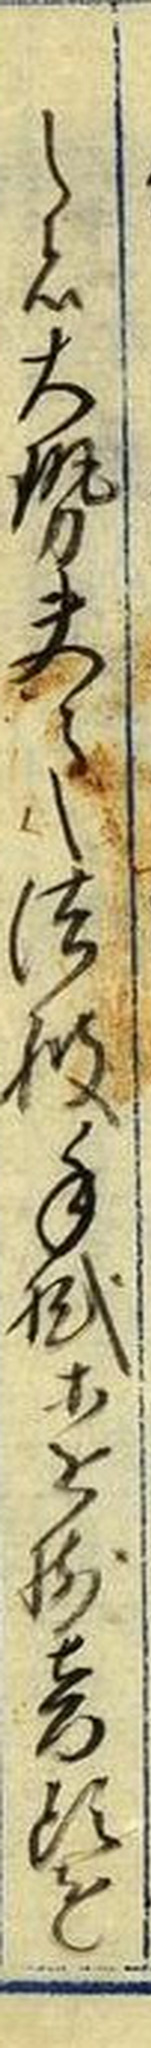之者大勢夫々之法被手拭等を揃音頭を
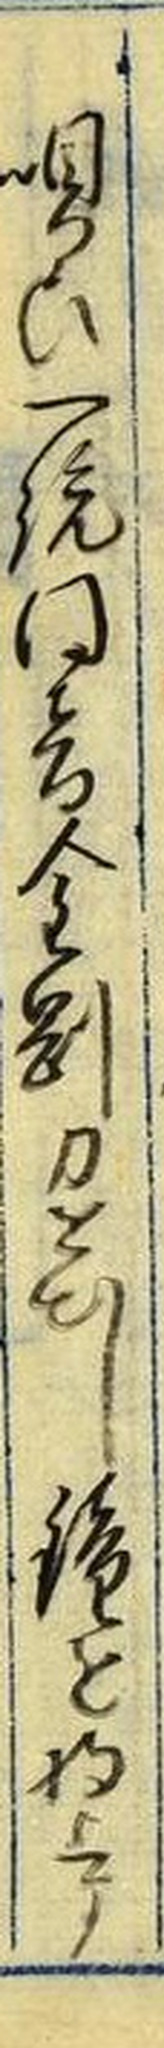唄ひ一統同音金剛力を出し鐘を持上ヶ

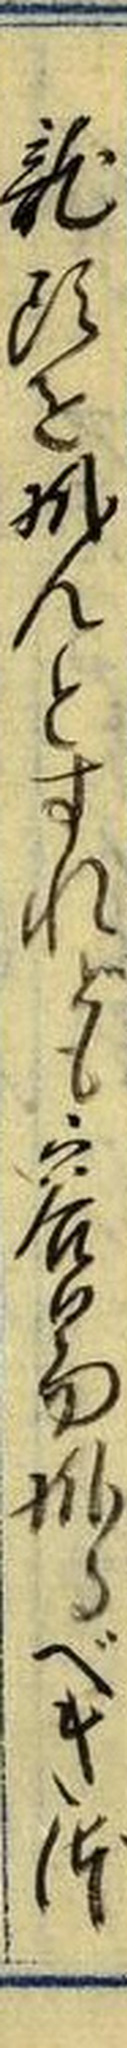龍頭を掛んとすれども容易掛るべき体
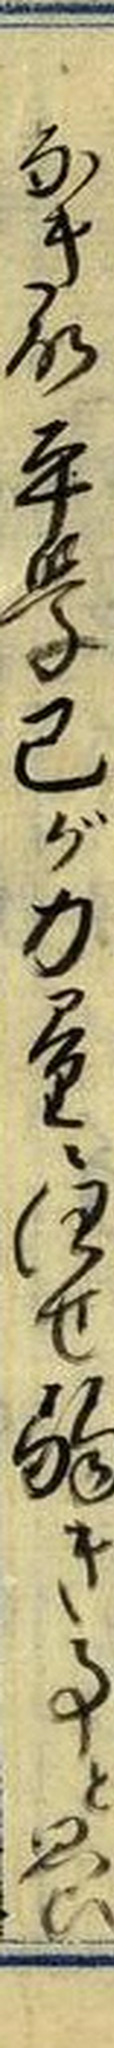なき故平学己が力量ニ任せ弱き事と思い
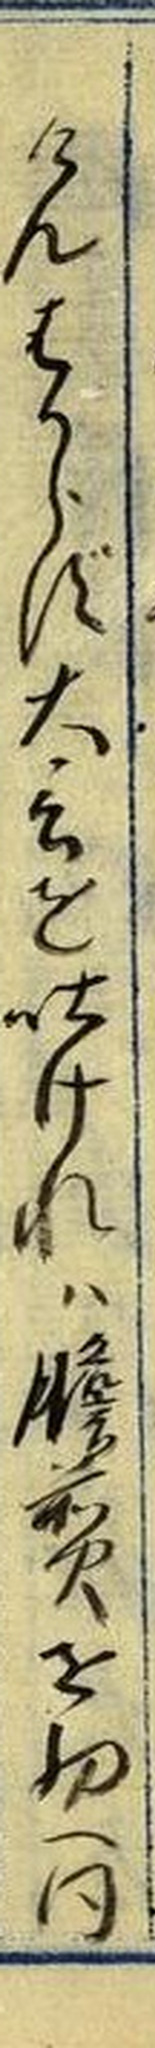けんはからず大言を吐けれハ膽煎を初一同
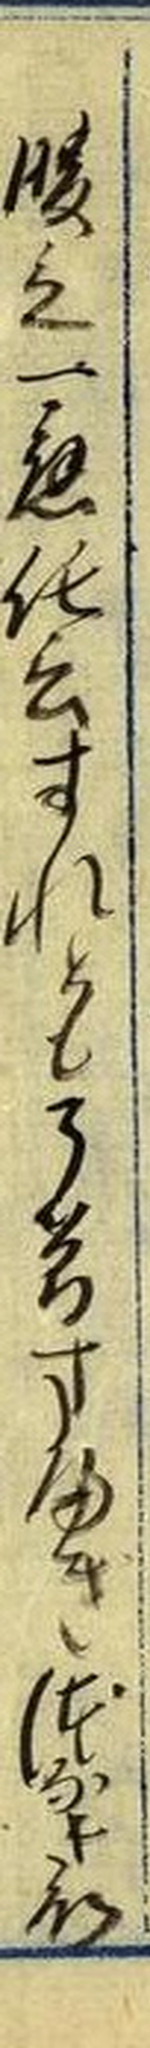腹立一応仛言すれども了簡すへき体なき故
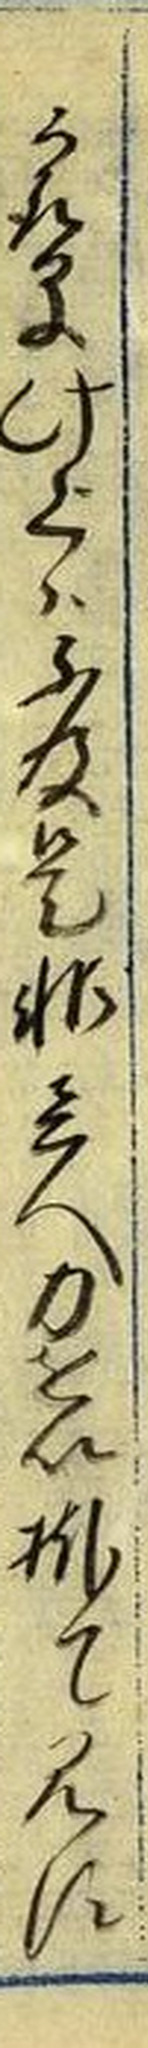最早此上ハ不及是非壱人力を以掛て見す
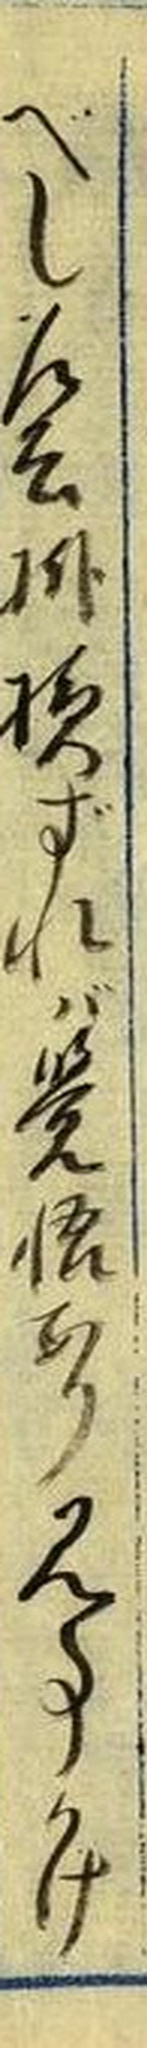べし乍去掛損ずれバ覚悟あり見事かけ
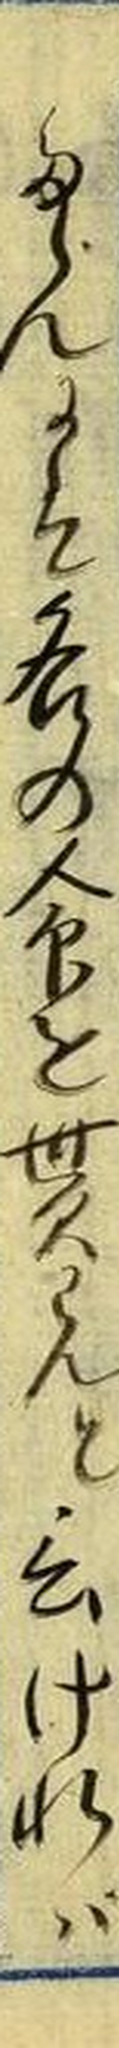たらんには各の命貰わんと言ければ
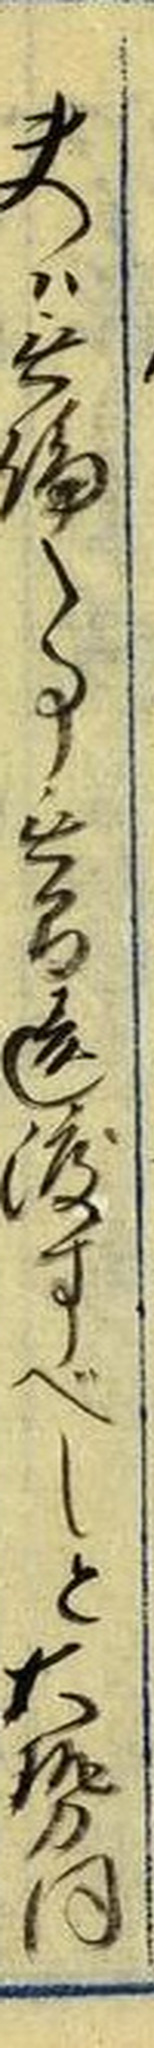夫ハ無論之事無間違渡しべしと大勢同
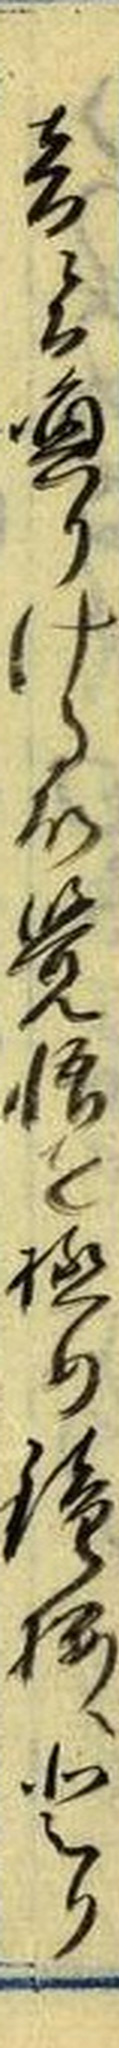音ニ而喚りける故覚悟を極め鐘楼へ登り
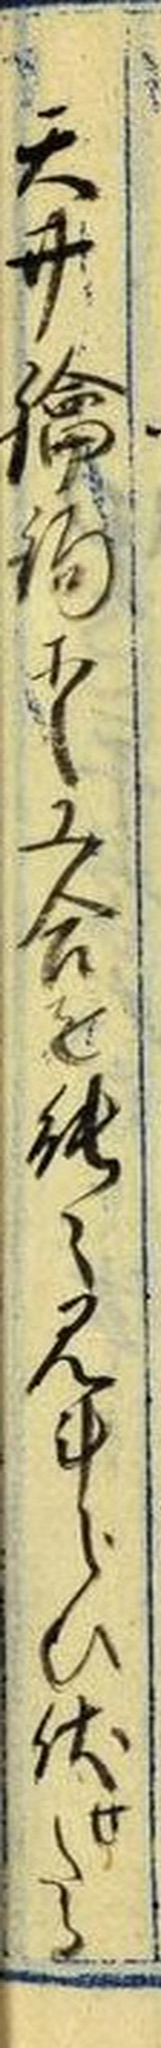天井鑰釣等之工合を能々見計らひ伏せたる
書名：温古集 三巻
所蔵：福井県文書館 Fukui Prefectural Archives
